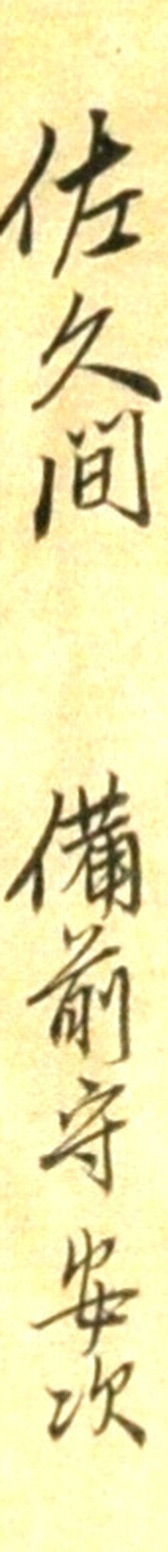佐久間備前守安次
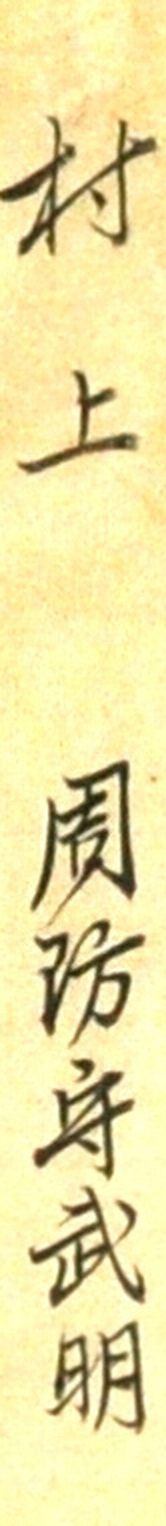村上周防守武明
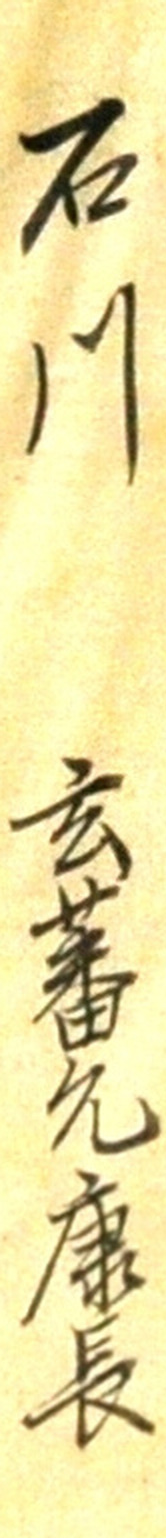石川玄蕃允康長
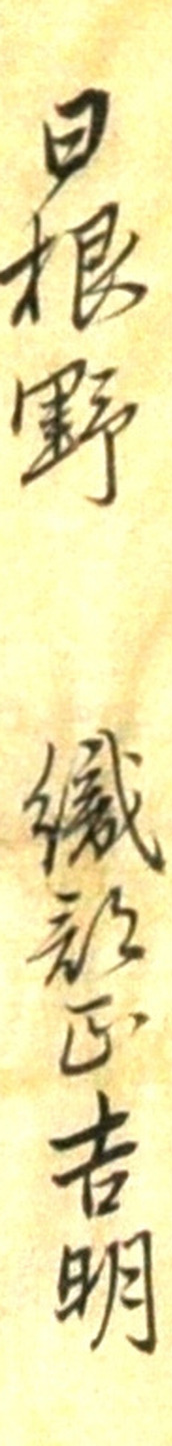日根野織部正吉明

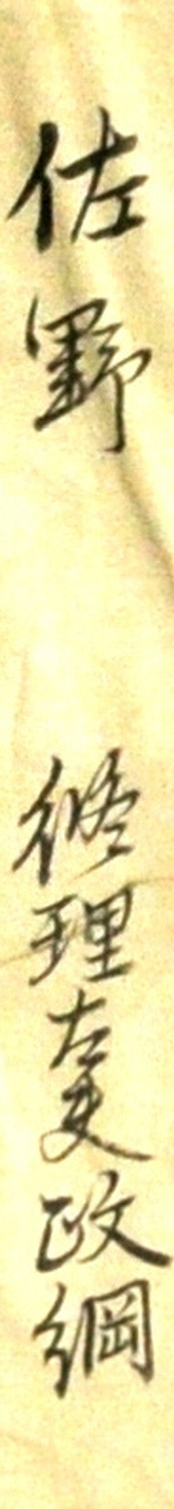佐野修理太夫政綱
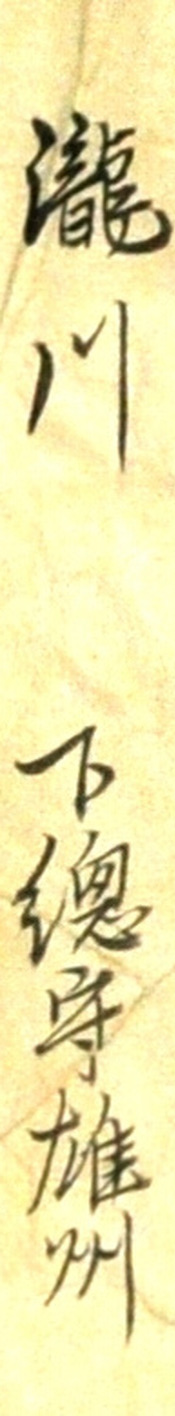滝川下総守雄州
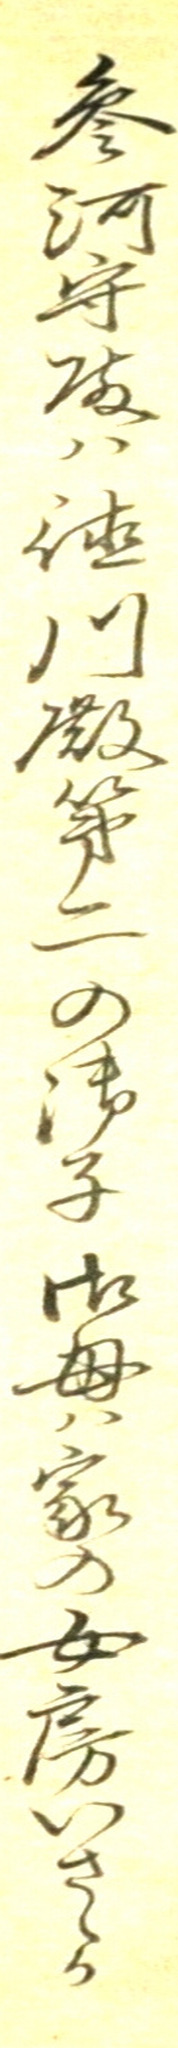参河守殿は徳川殿第二の御子御母は家の女房いさゝか
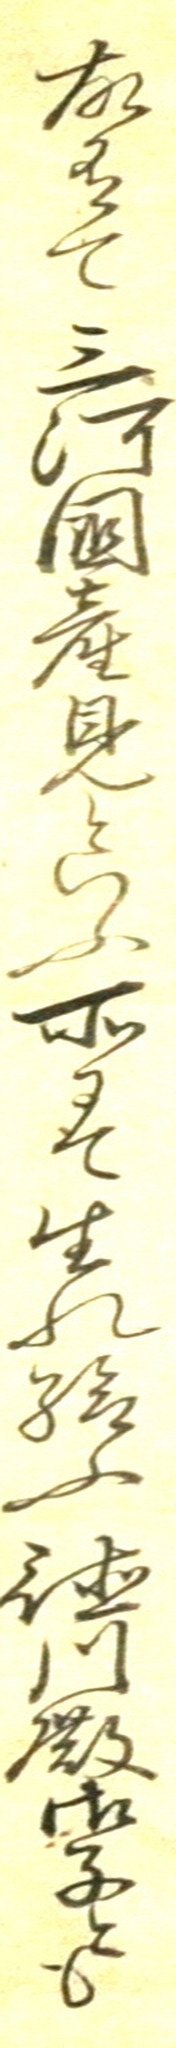故有て三河国産見といふ所にて生れ給ふ徳川殿御子とも
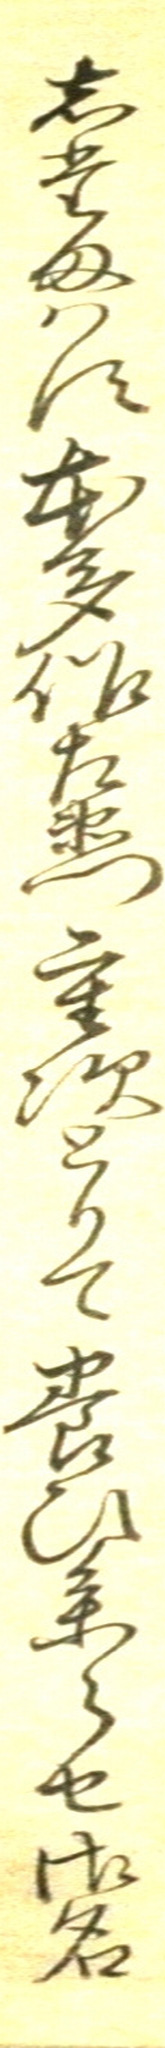したまはす本多作左衛門重次とりて養ひ参らせ御名
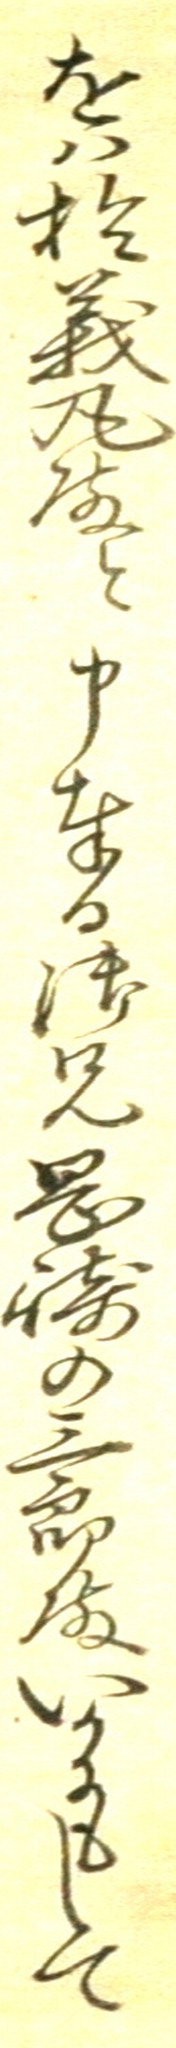をは於義丸殿と申奉る御兄岡崎の三郎殿いかにもして
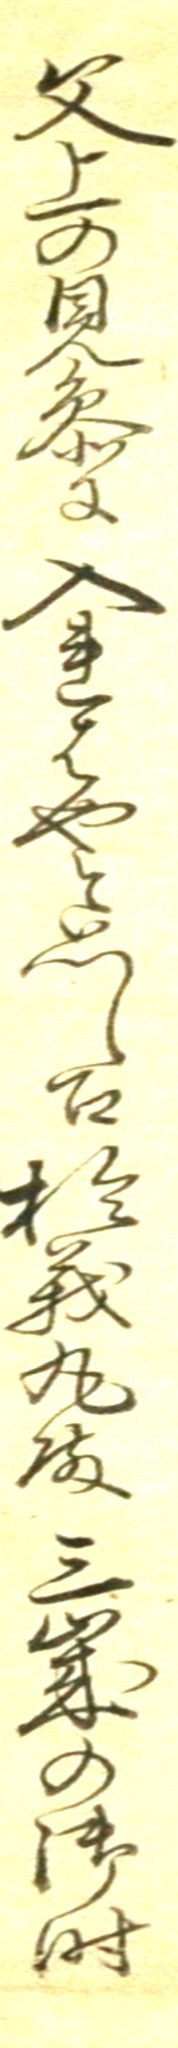父上の見参に入れはやと思し召於義丸殿三歳の御時
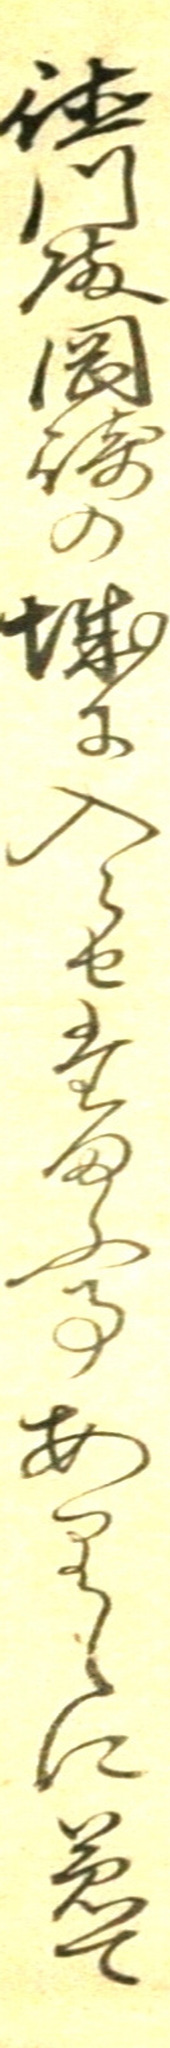徳川殿岡崎の城に入らせたまふ事ありしに兼て
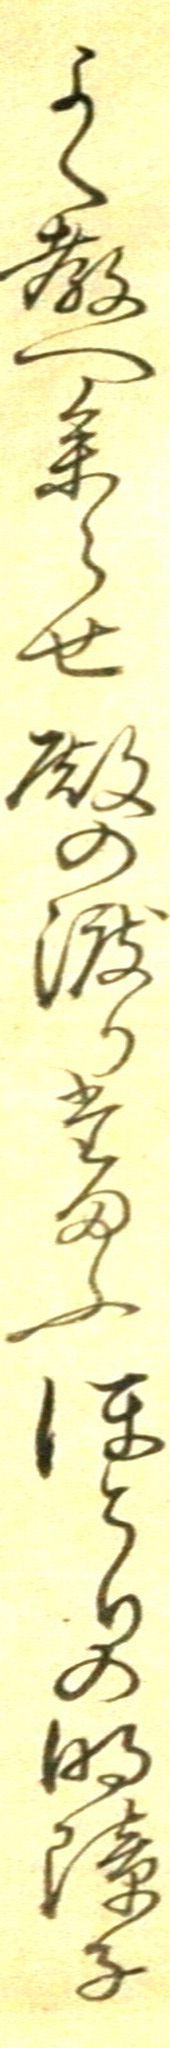よく教へ参らせ殿の渡りたまふほとりの明障子
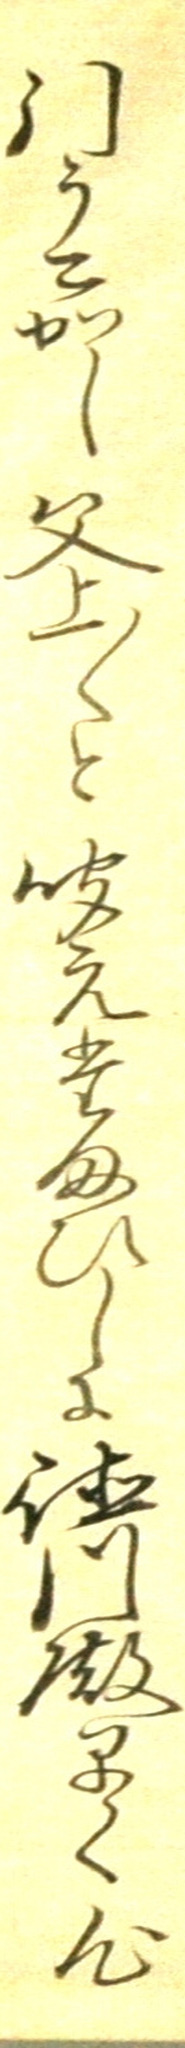引うこかし父上〳〵と聞えたまひしに徳川殿早く心
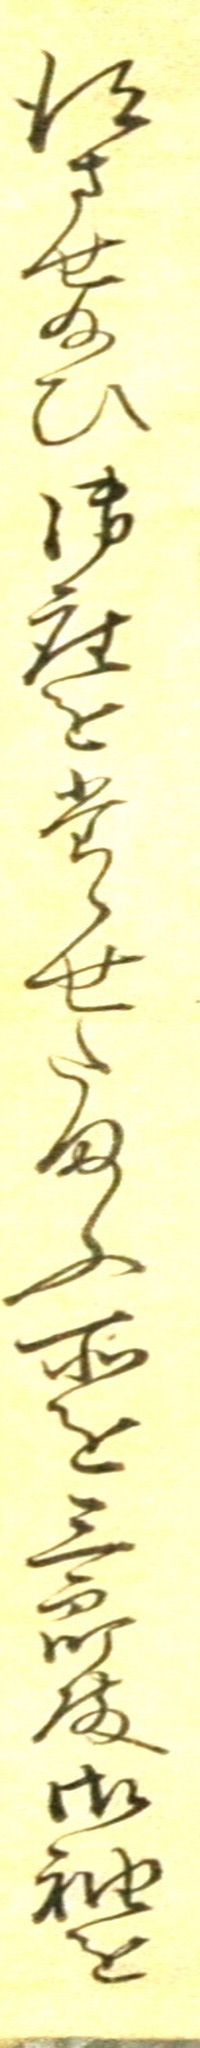得させ給ひ御座をたゝせたまふ所を三郎殿御袖を

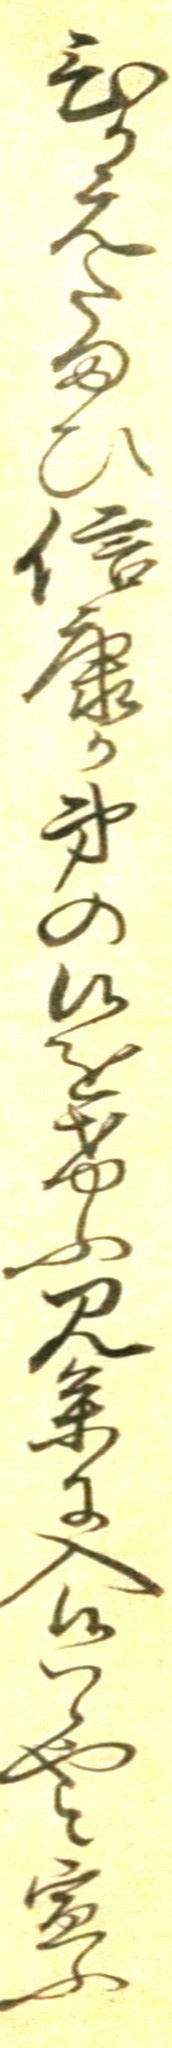ひかえたまひ信康か弟の候をけふ見参に入候はゝやと宣ふ
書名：藩翰譜（一）
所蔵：伊那市立高遠町図書館・合同会社AMANE
